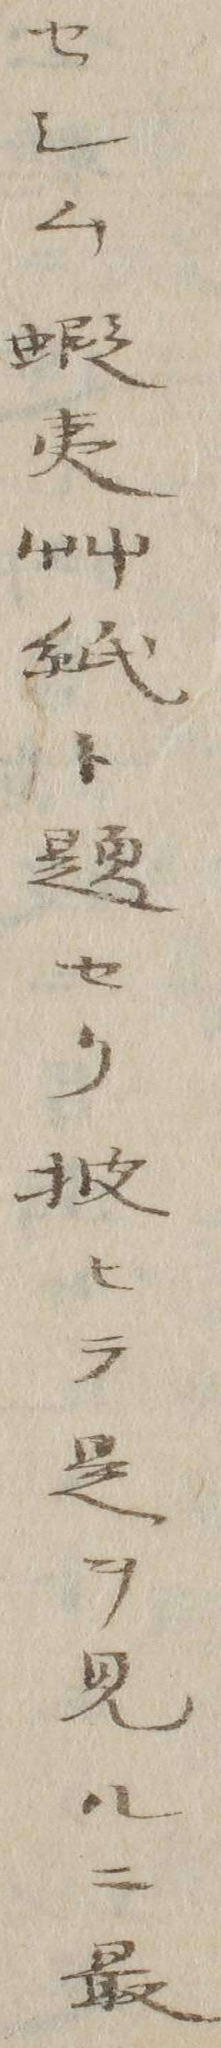セシム蝦夷草紙ト題セリ披ヒテ是ヲ見ルニ最
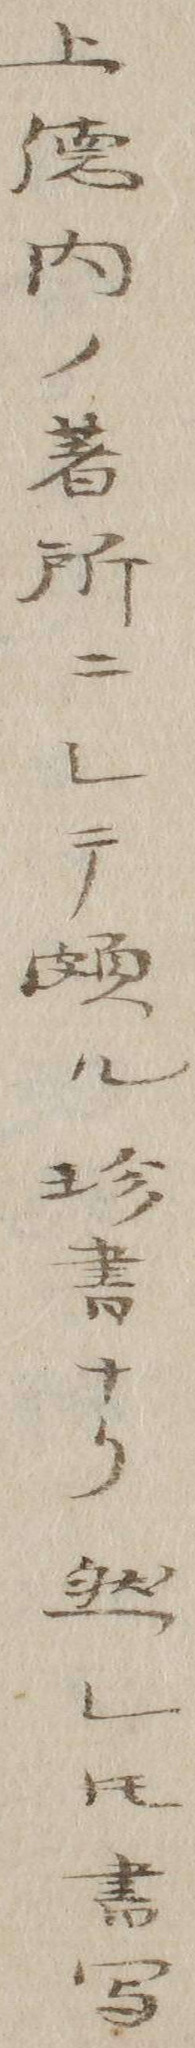上徳内ノ著所ニシテ頗ル珍書ナリ然レトモ書写
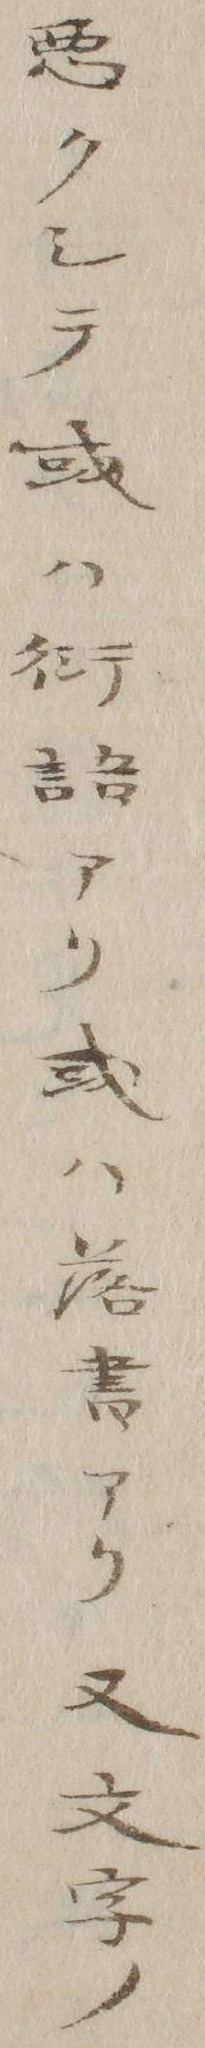悪クシテ或ハ衍語アリ或ハ落書アリ又文字ノ
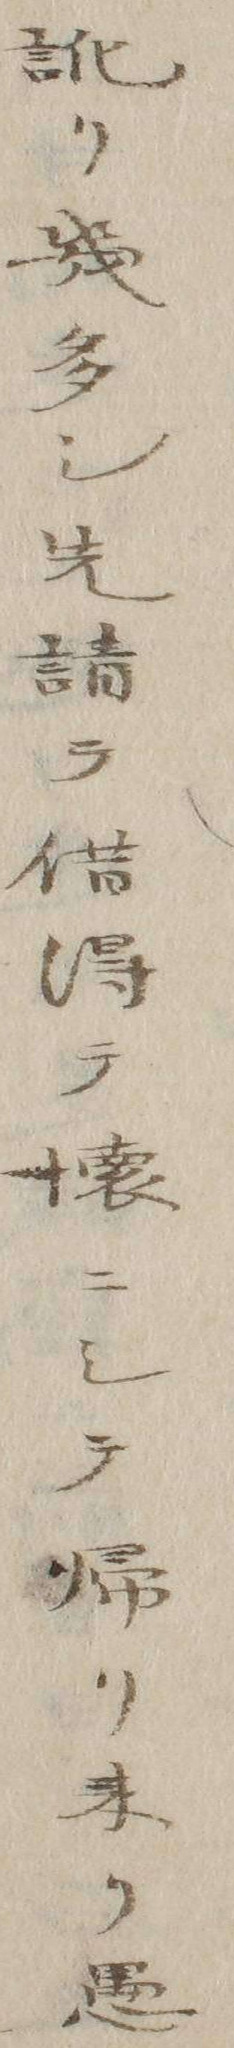訛リ幾多シ先請テ借得テ懐ニシテ帰リ来リ愚
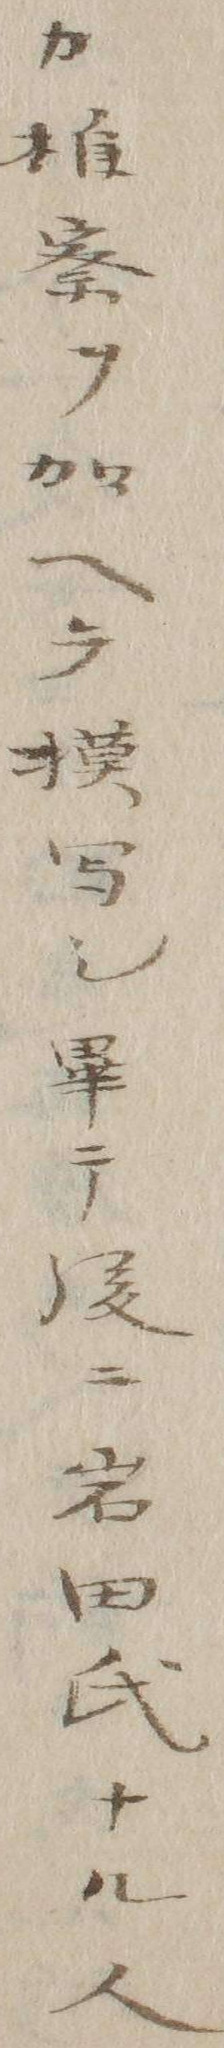カ推察ヲ加ヘテ摸写シ畢テ後ニ岩田氏ナル人
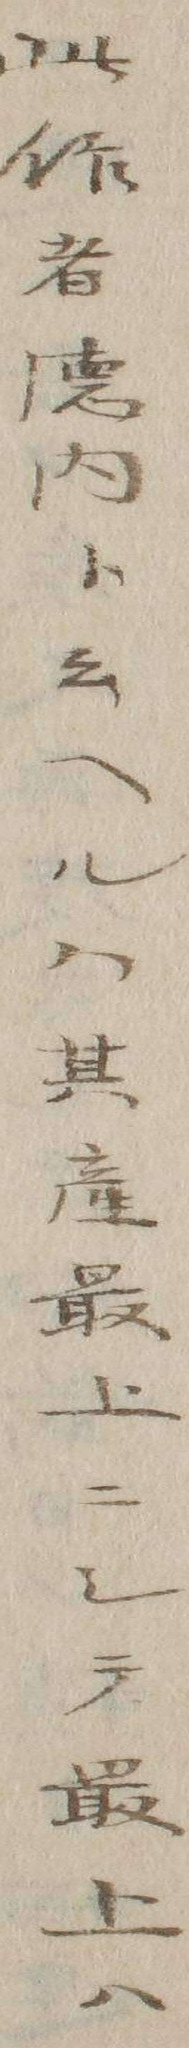此作者徳内ト云ヘルハ其産最上ニシテ最上ハ
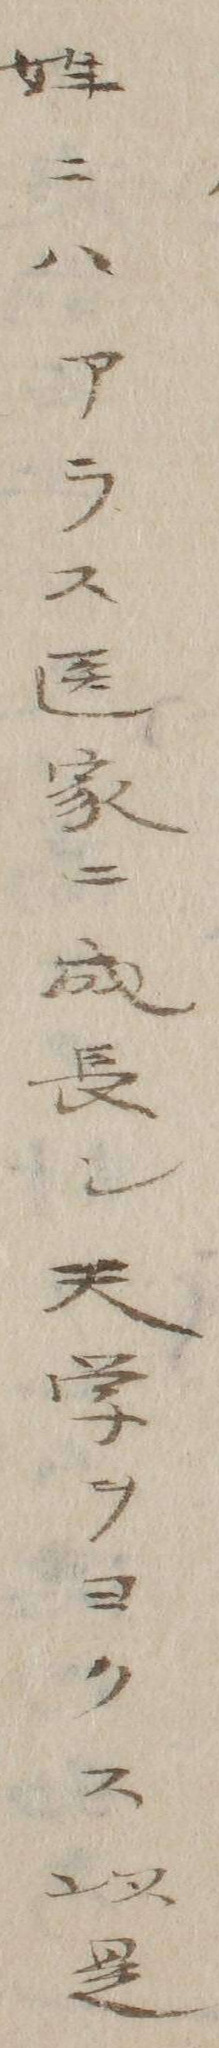姓ニハアラス医家ニ成長シ天学ヲヨクス以是
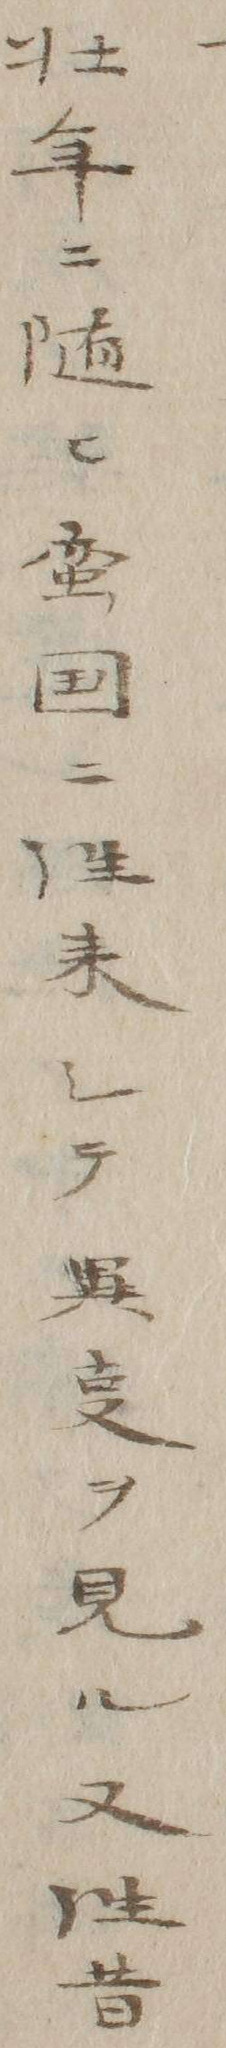壮年ニ随ヒ蛮国ニ往来シテ異事ヲ見ル又往昔
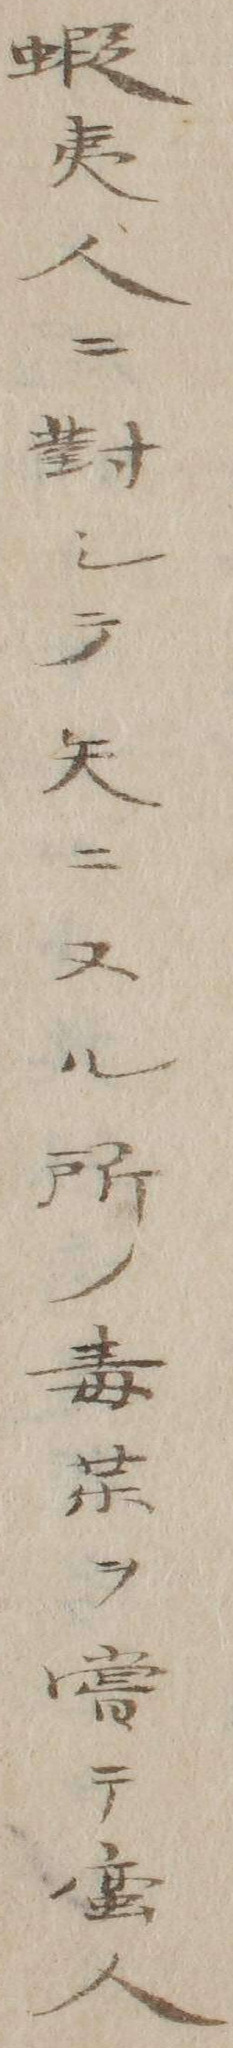蝦夷人ニ対シテ矢ニスル所ノ毒薬ヲ嘗テ蛮人

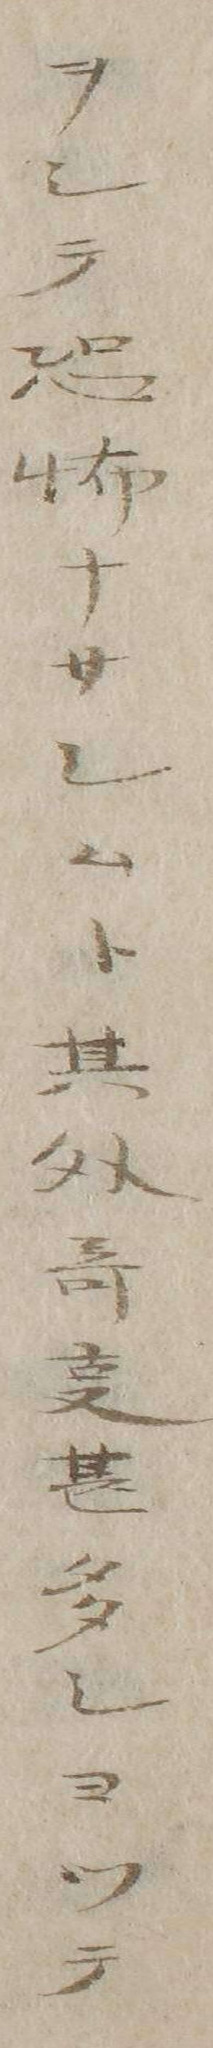ヲシテ恐怖ナサシムト其外奇事甚多シヨツテ
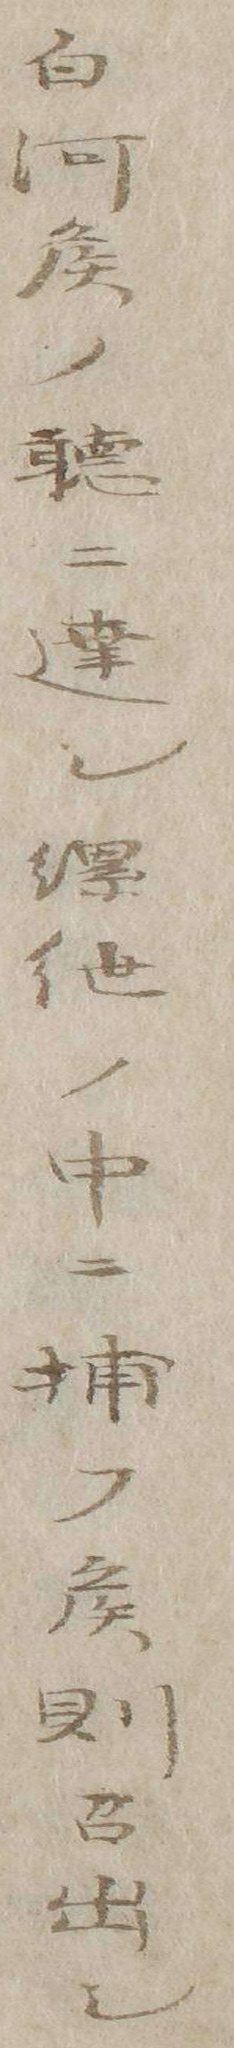白河侯ノ聴ニ達シ縲紲ノ中ニ捕フ侯則召出シ
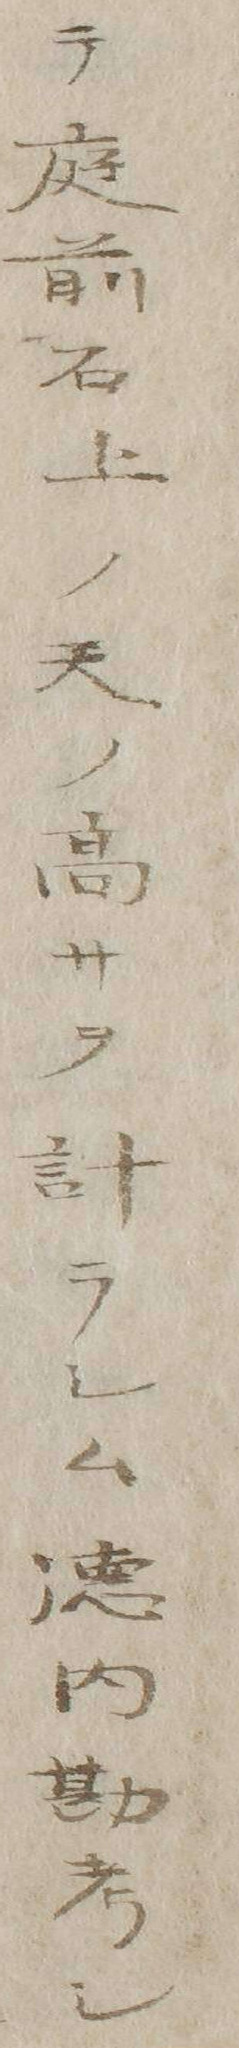テ庭前石上ノ天ノ高サヲ計ラレム徳内勘考シ
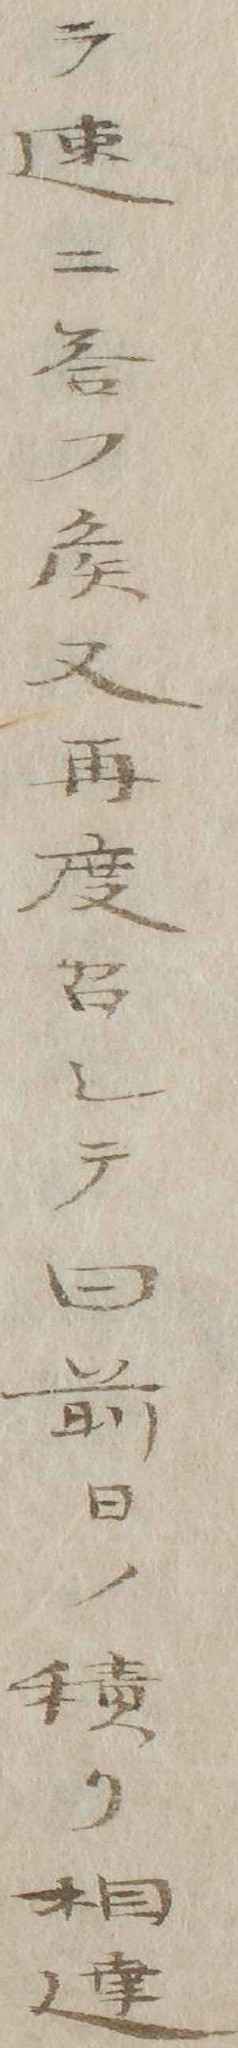テ速ニ答フ侯又再度召シテ曰前日ノ積リ相達
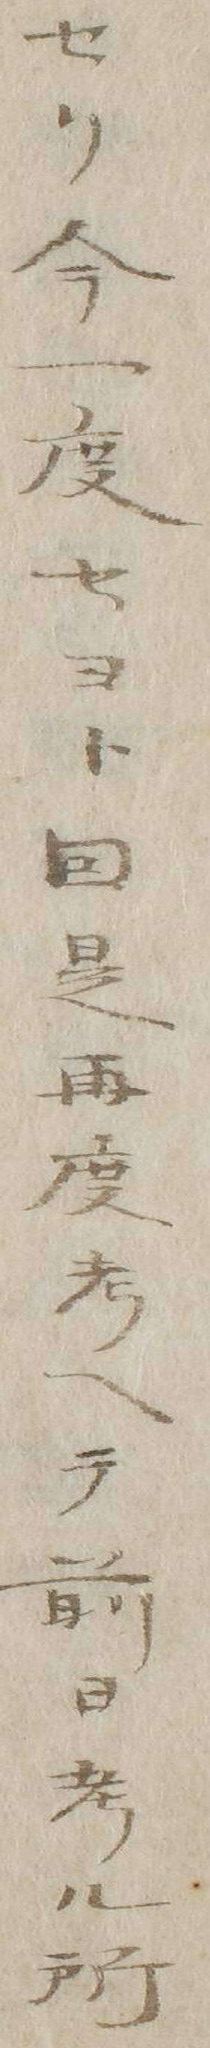セリ今一度セヨト回是再度考ヘテ前日考ル所
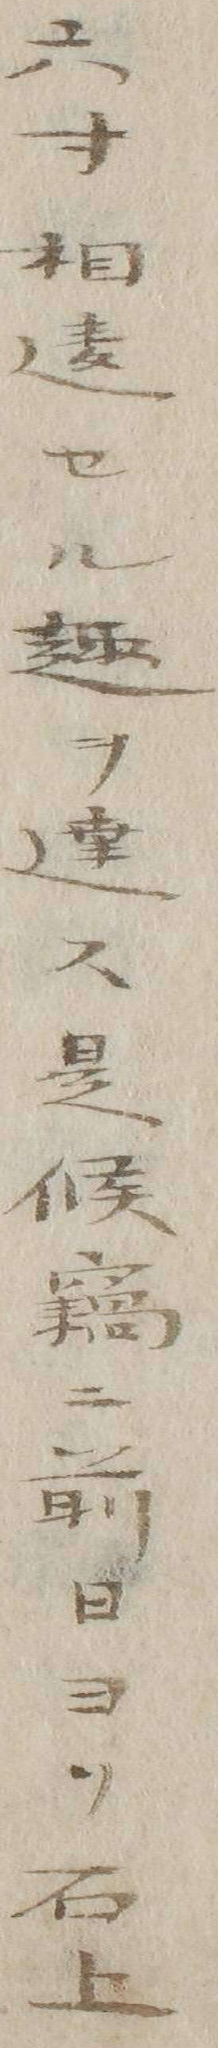六寸相違セル趣ヲ達ス是候窃ニ前日ヨリ石上
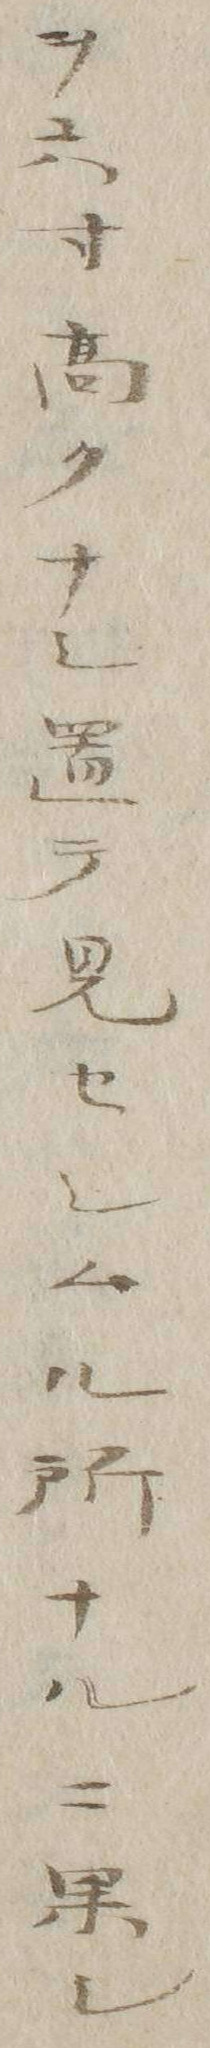ヲ六寸高クナシ置テ見セシムル所ナルニ果シ
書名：蝦夷草紙（国文学研究資料館）
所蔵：国文学研究資料館
